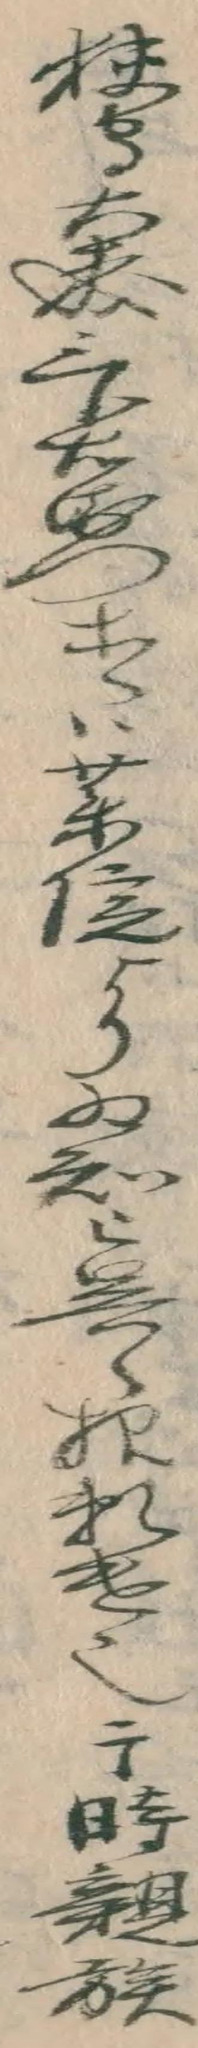狭守大森三郎右衛門等へハ薬院より為知被呉候様頼遣也于時親族
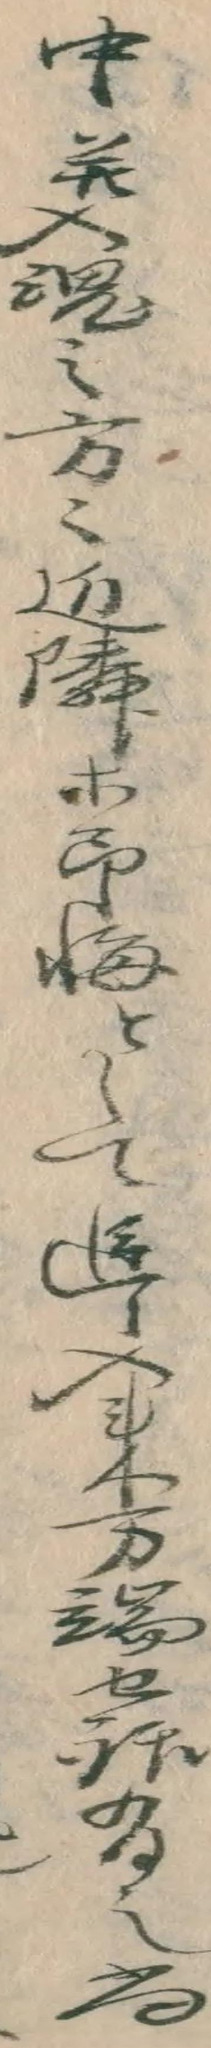中并入魂之方々近隣等即悔として追々入来万端世話有之尚
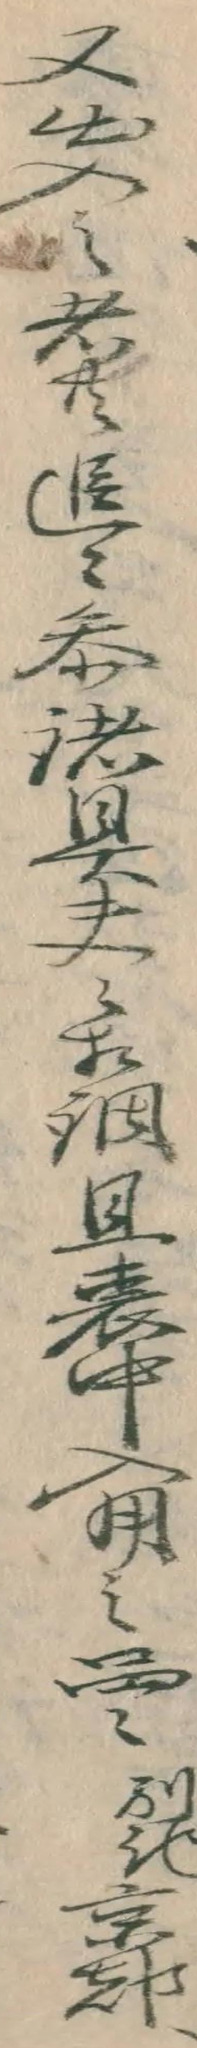又出入之者共追々参諸具夫々相調且喪中入用之品々別記京都へ
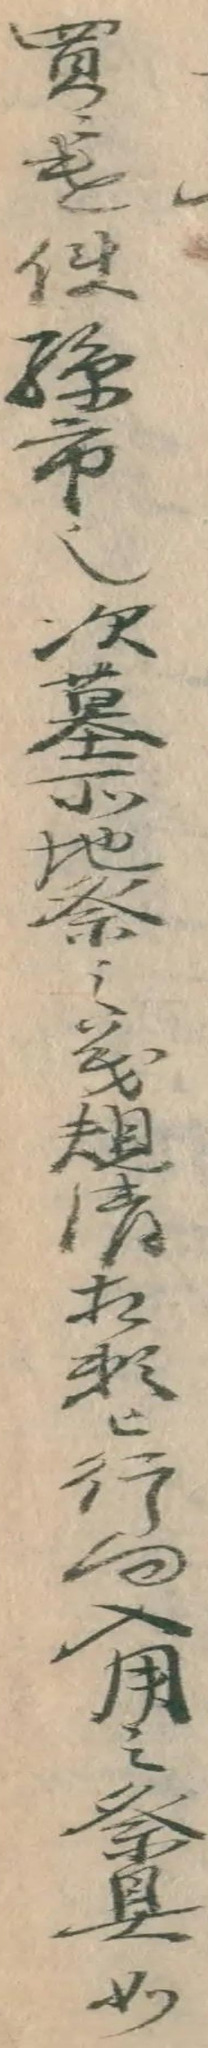買二遣使孫市也次墓所地祭之義規清相頼被行向入用之祭具如

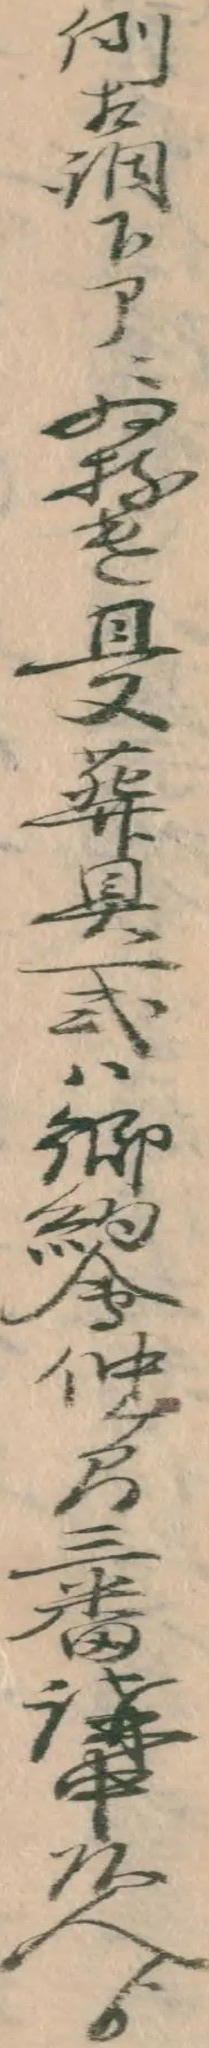例相調下申ニ為持遣且又葬具一式ハ郷約會仲ケ間三番講中頭人ゟ
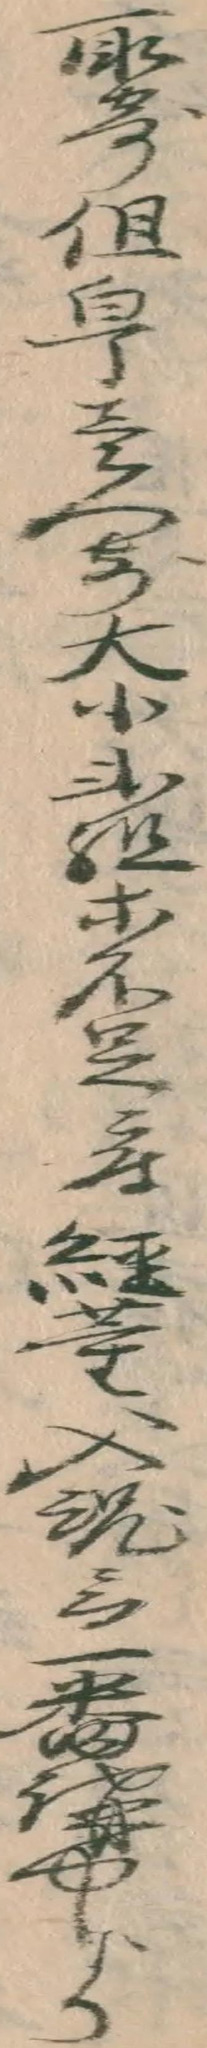取寄但白丁壱人前大小弐組等不足ニ付経董へ入魂ニ而一番講中より
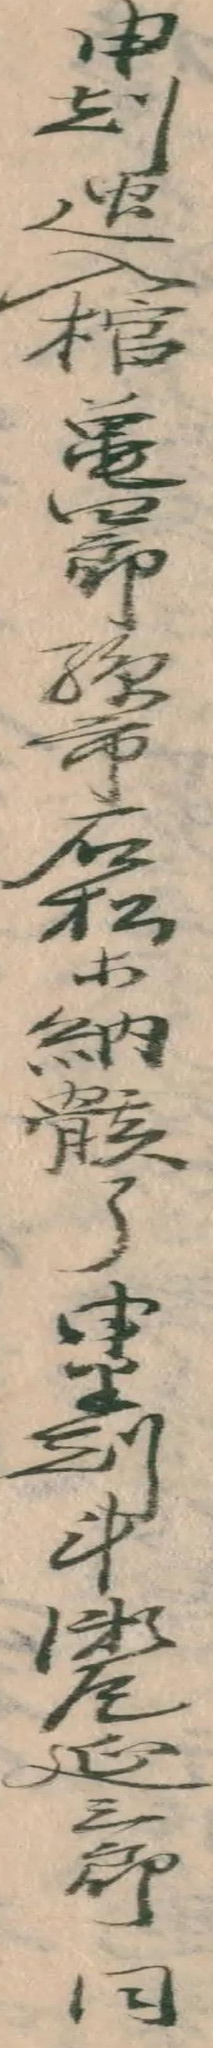申刻過入棺亀四郎孫市右松等納骸了申半刻斗瀬尾延三郎同
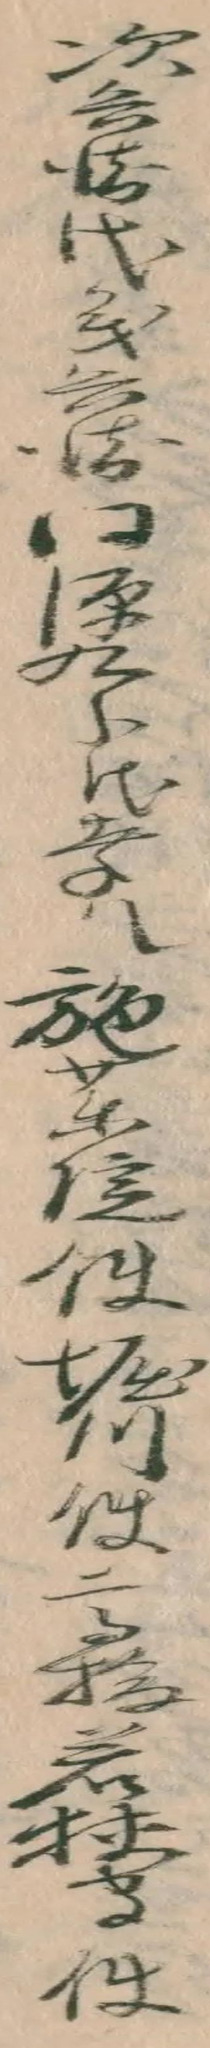次兵衛代義兵衛同源九郎代施薬院使堀川使高橋若狭守使等
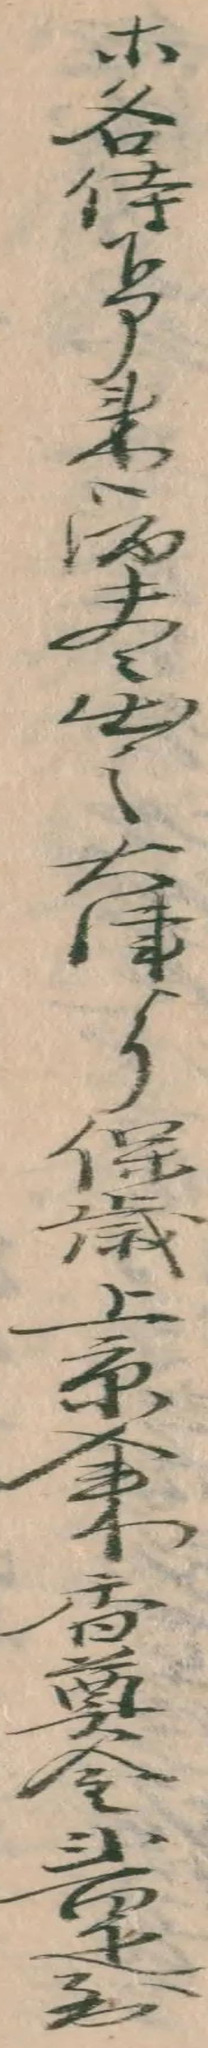等各侍下申来御酒夫々出之大津より保歳上京入来香奠金弐百疋置
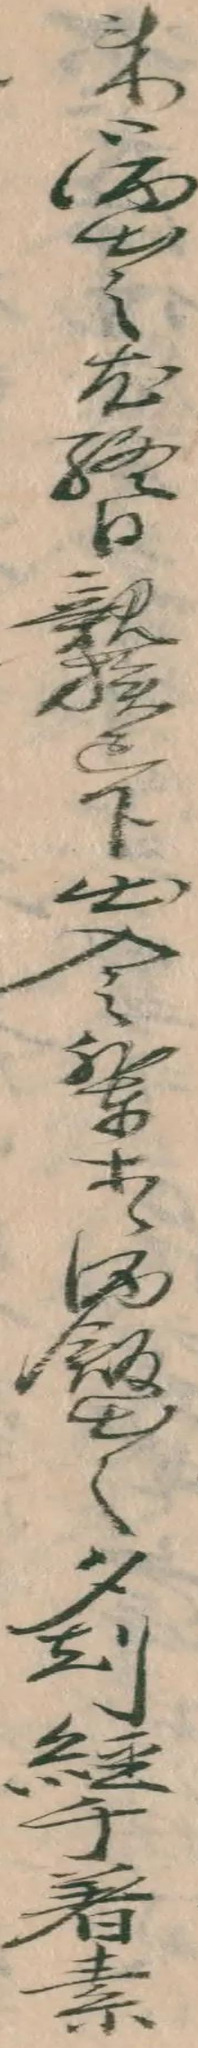来御酒出也尤終日親族已下出入之輩等之酒飯出也夕刻経干着素
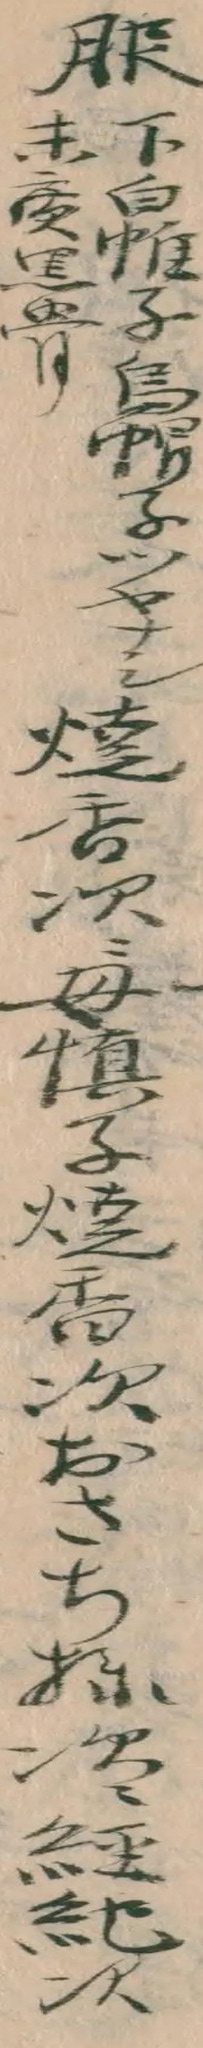服下帷子烏帽子ツヤナシ末廣黒骨焼香次ニ母慎子焼香次おさち様次ニ経紀次
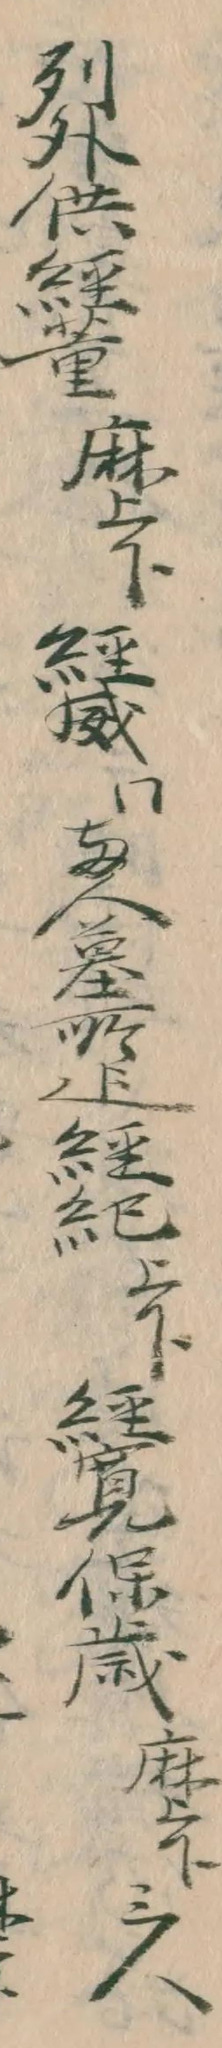列外供経董麻上下経威同両人墓所迄経紀上下経寛保歳上下三人
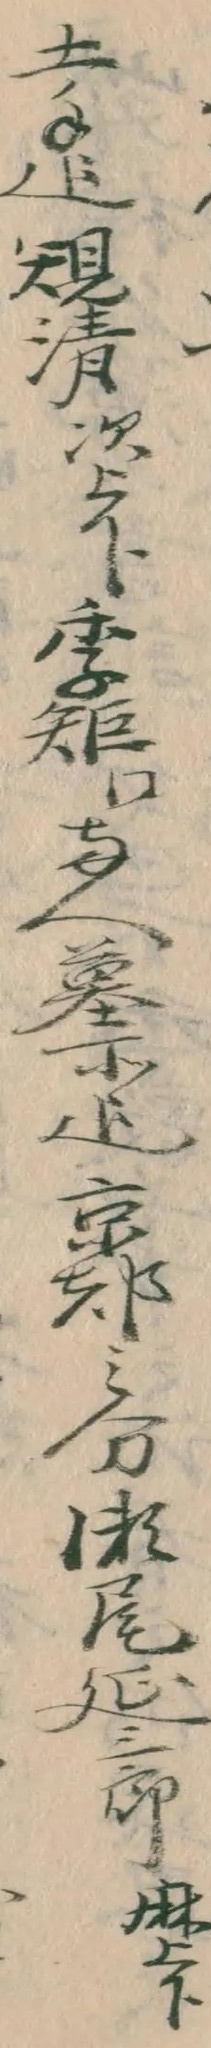土手迄規清次上下季矩同御両人墓所迄京都之分瀬尾延三郎麻上下
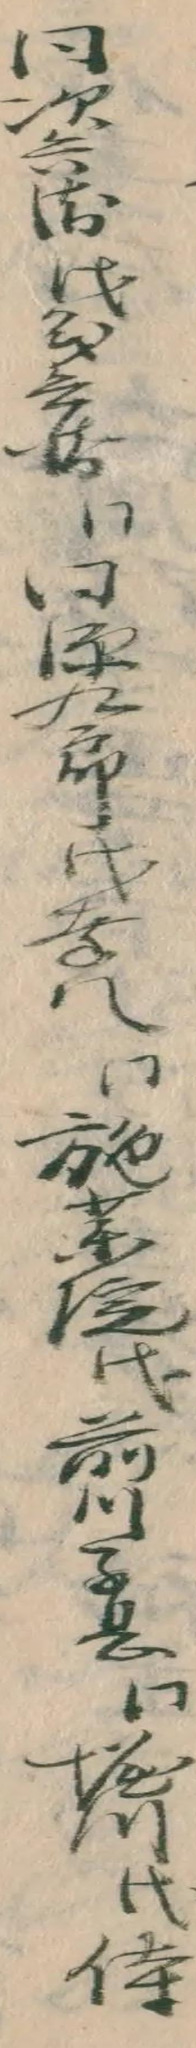同次兵衛代義兵衛同源九郎代豊八同施薬院代前川子息同堀川代侍
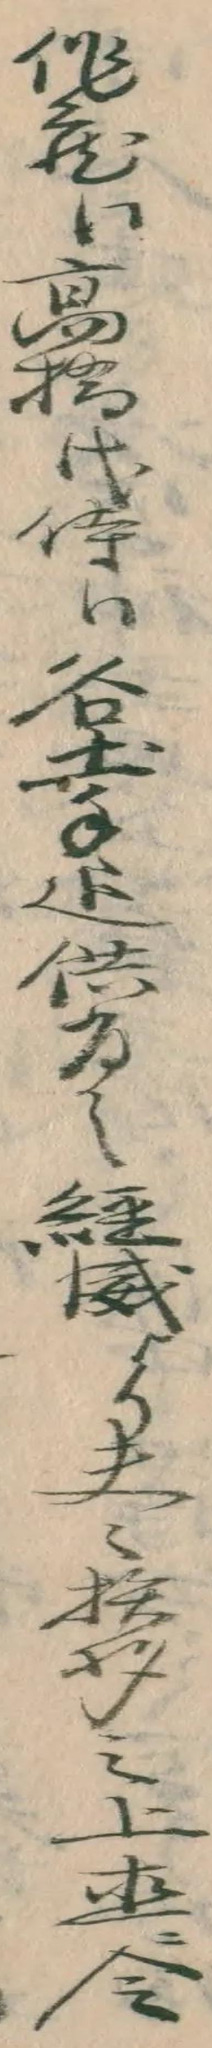作蔵候高橋代侍候各土手迄供有之経威より夫々挨拶之上直令
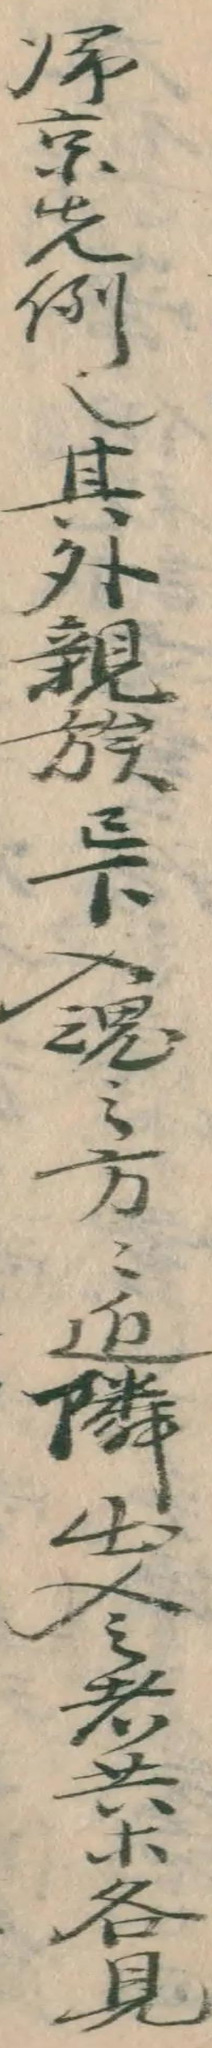帰京先例也其外親族已下入魂之方々近隣出入之者共等各見
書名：賀茂社記録. 第65冊
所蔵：国立国会図書館 National Diet Library, JAPAN
